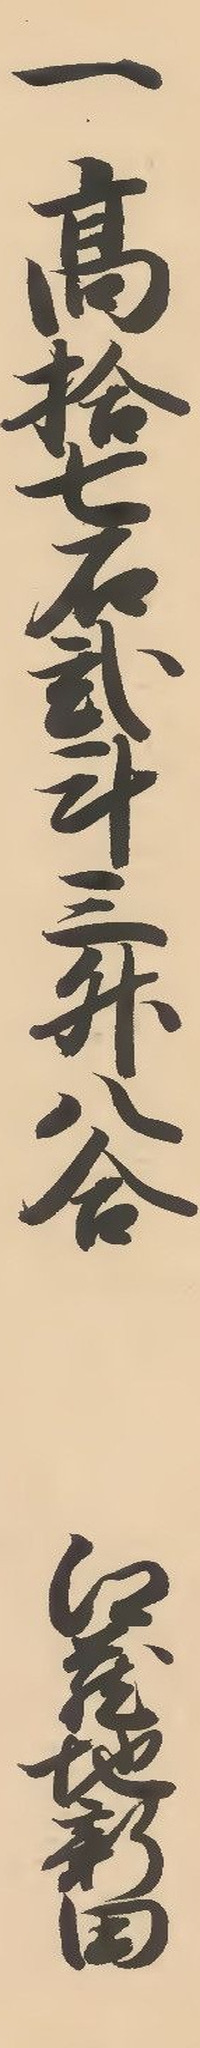一高拾七石弐斗三升八合江蔵地新田
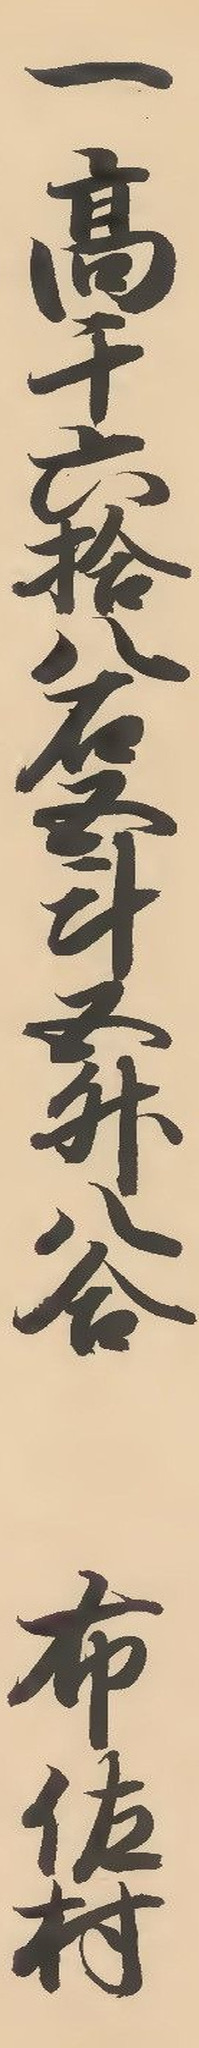一高千六拾八石五斗五升八合布佐村
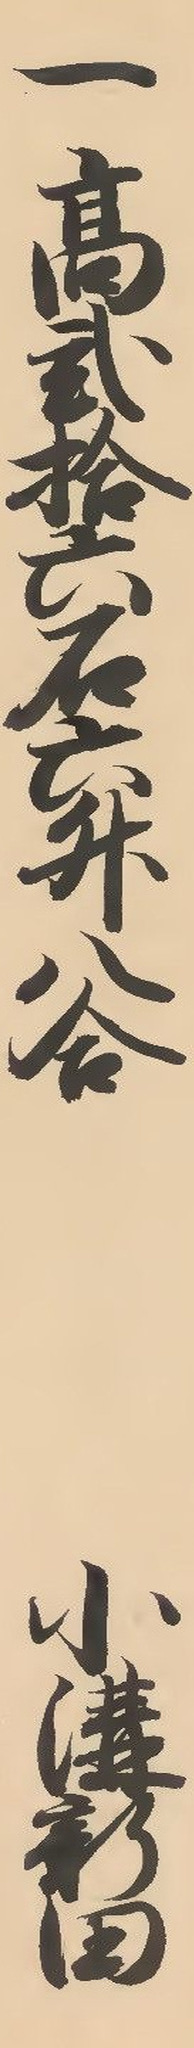一高弐拾六石六升八合小溝新田
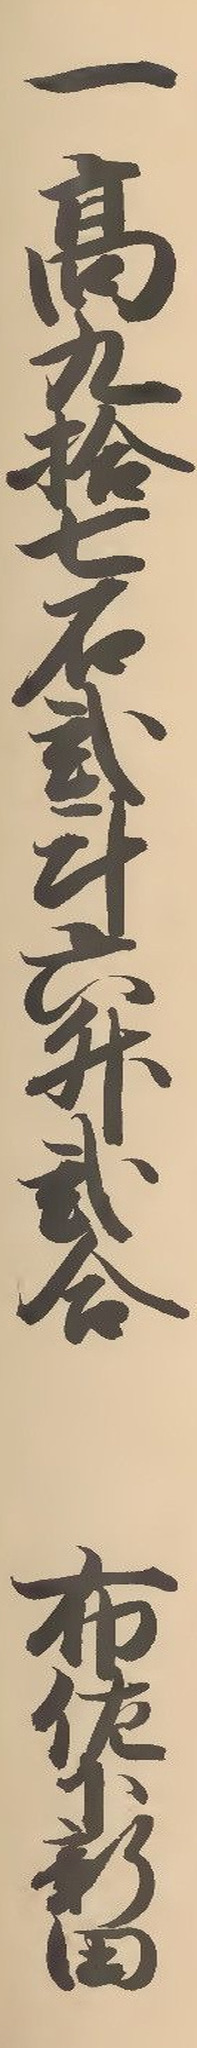一高九拾七石弐斗六升弐合布佐下新田
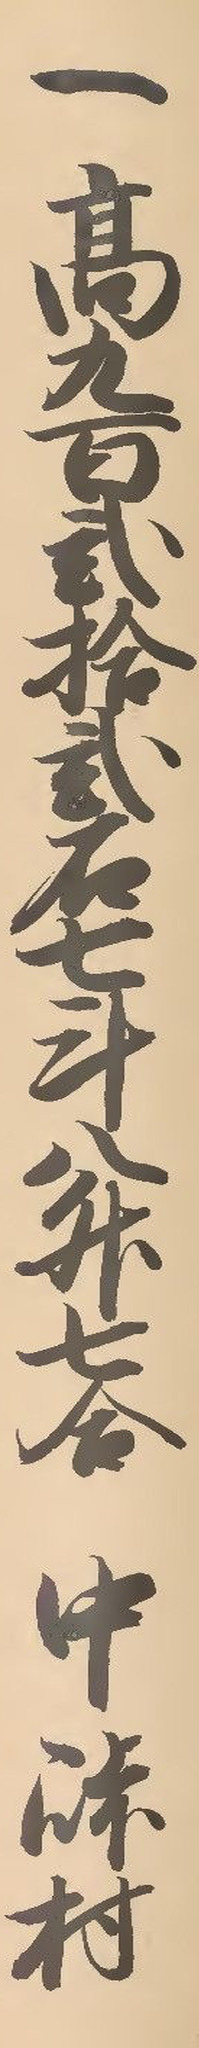一高九百弐拾弐石七斗八升七合中峠村
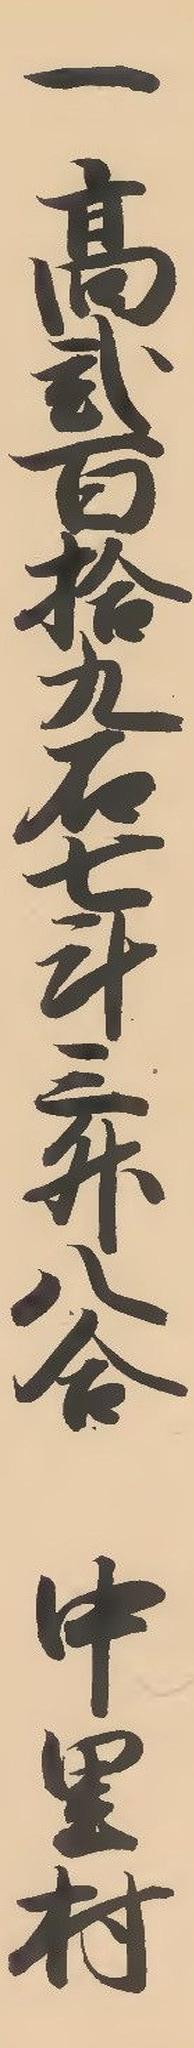一高弐百拾九石七斗三升八合中里村
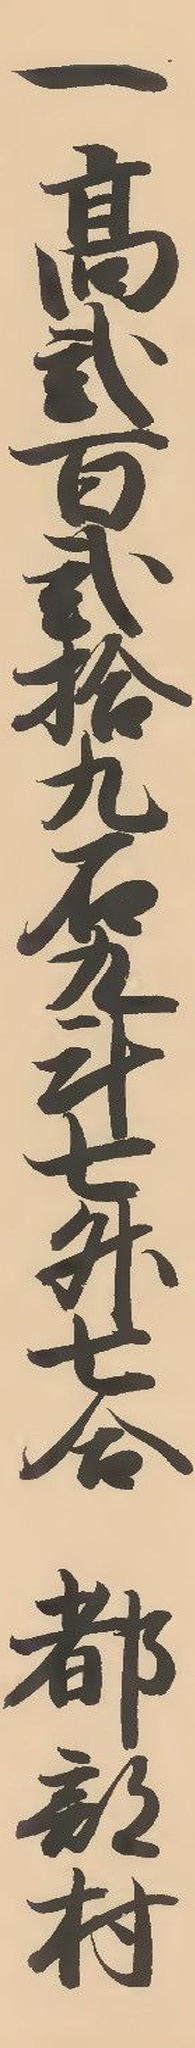一高弐百弐拾九石九斗七升七合都部村
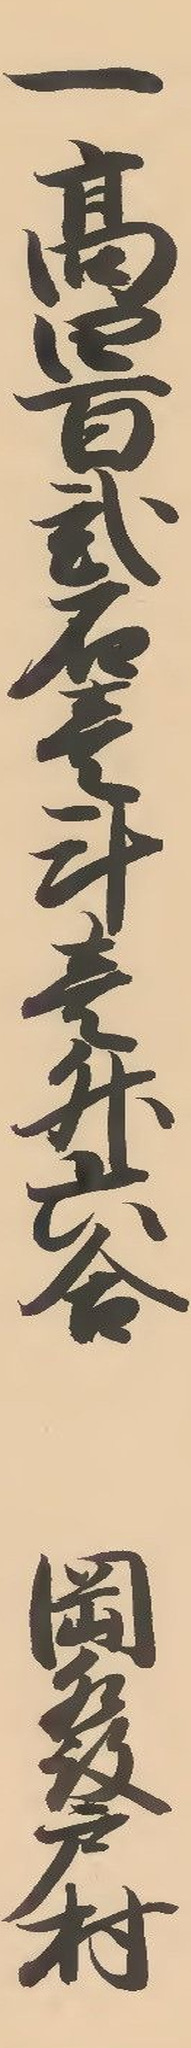一高四百弐石壱斗壱升六合岡発戸村

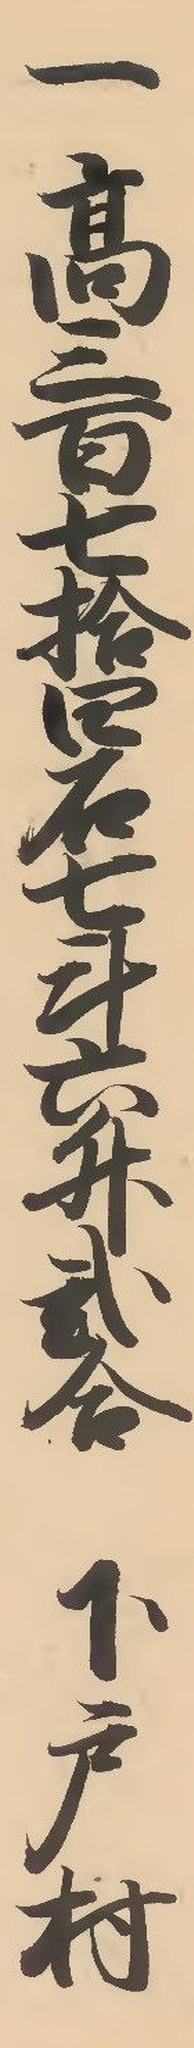一高三百七拾四石七斗六升弐合下戸村
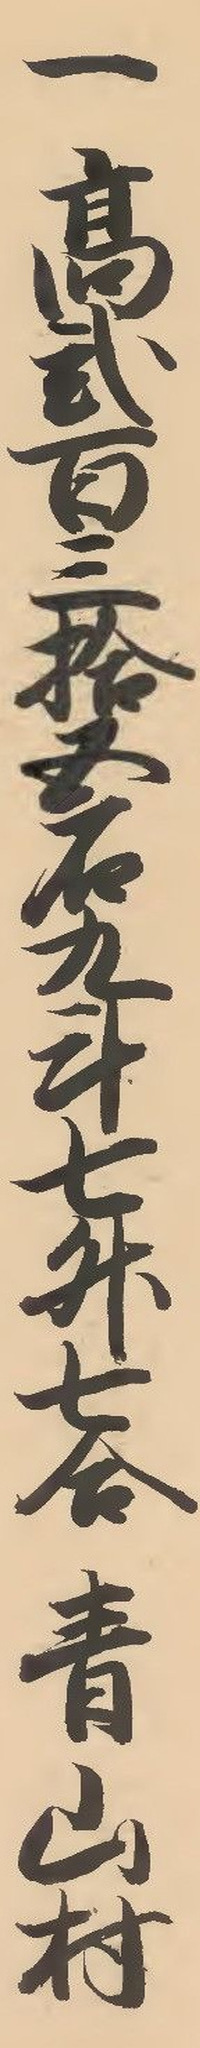一高弐百三拾五石九斗七升七合青山村
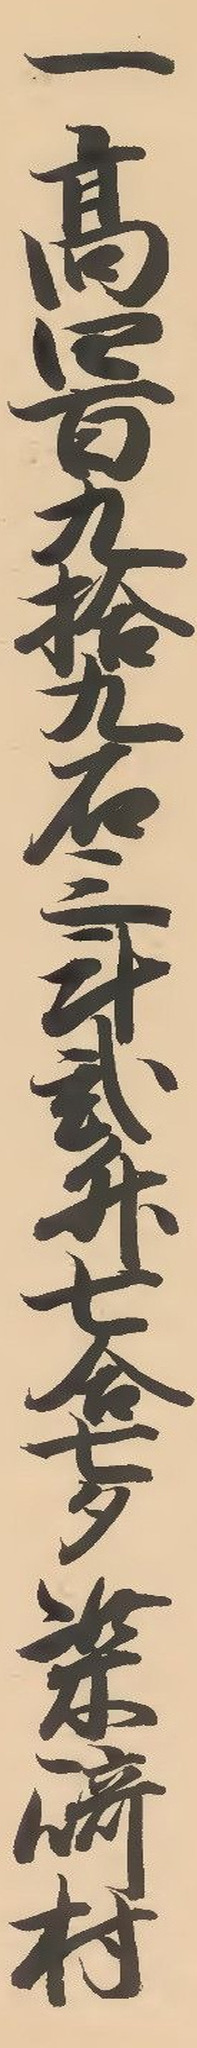一高四百九拾九石三斗弐升七合七勺柴崎村
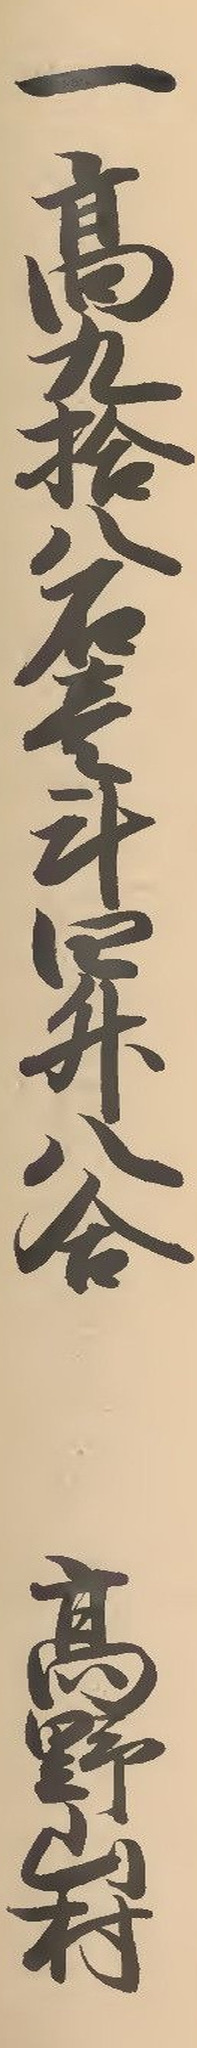一高九拾八石壱斗四升八合高野山村
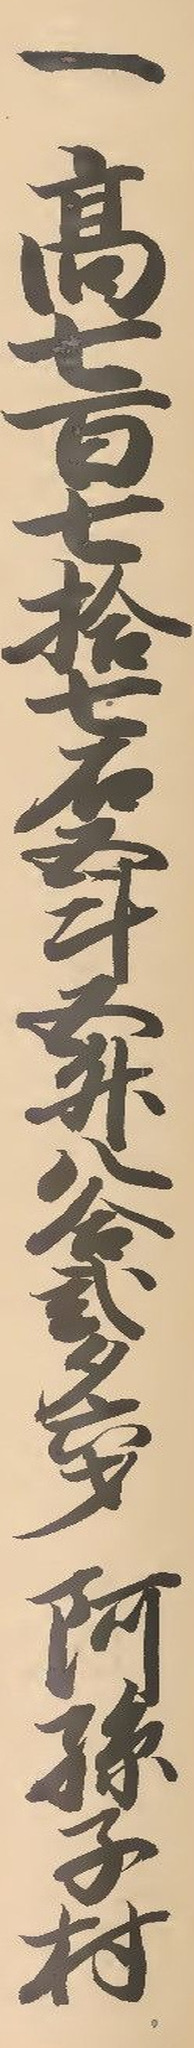一高七百七拾七石五斗五升八合弐勺六才阿孫子村
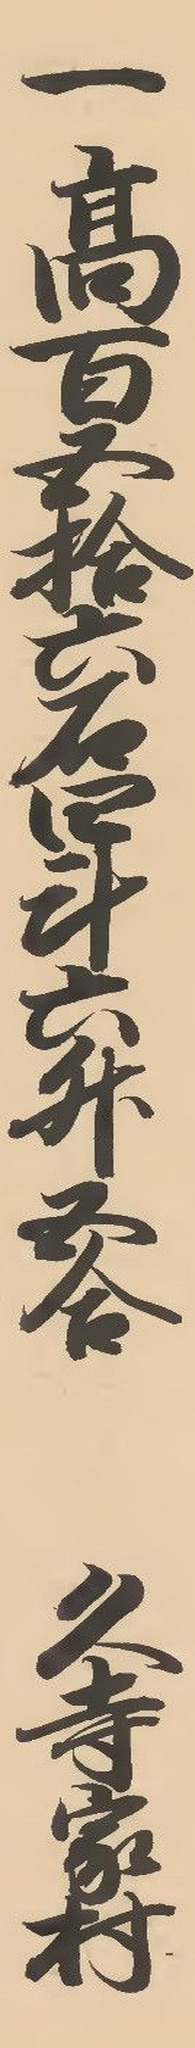一高百五拾六石四斗六升五合久寺家村
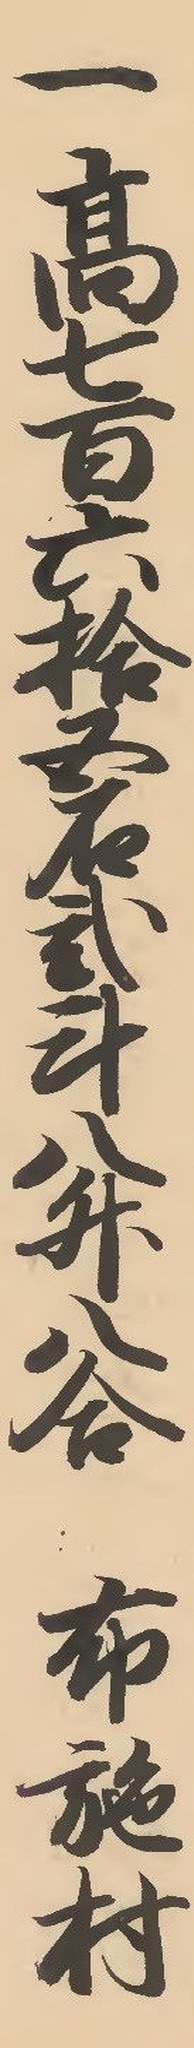一高七百六拾五石弐斗八升八合布施村
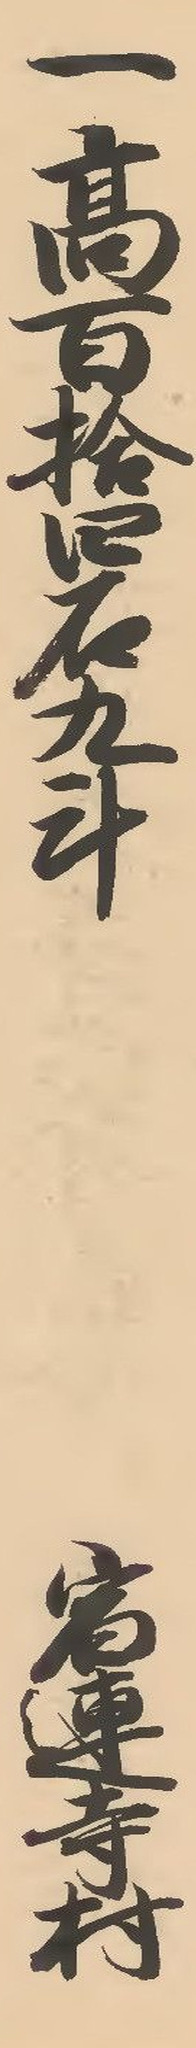一高百拾四石九斗宿連寺村
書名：下総国郷帳
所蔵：国立公文書館 National Archives of Japan
